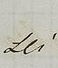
sei.
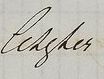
Spreche
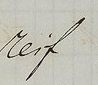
letzter
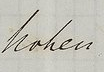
hohen
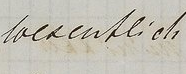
wesentlich
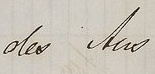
Da die
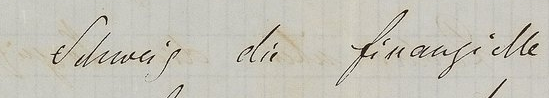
Schweiz die finanzielle
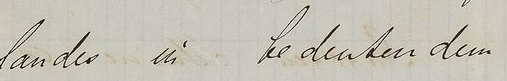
landes in bedeutendem
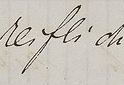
Masse in
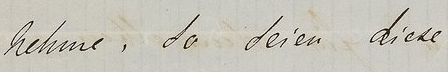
nehme, so seien diese
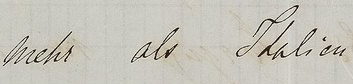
mehr als Italien
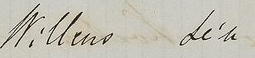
Willens sein werde
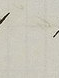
ein
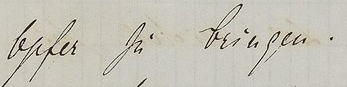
Opfer zu bringen.
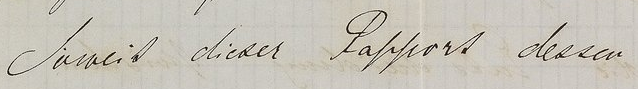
Soweit dieser Rapport dessen
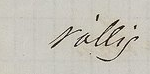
völlig
